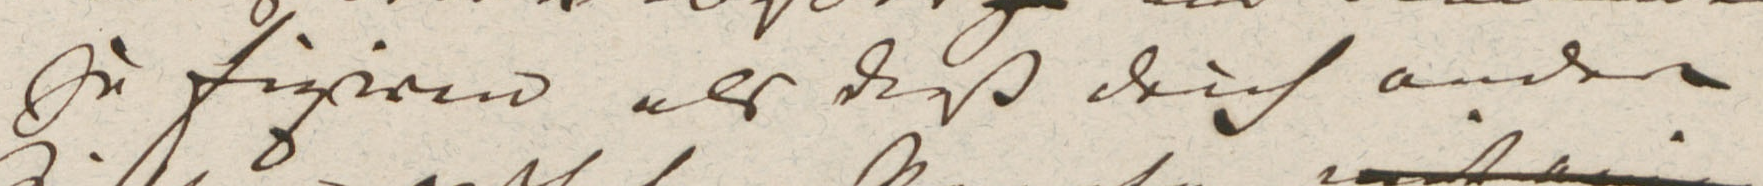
zu fixiren als diess durch andere
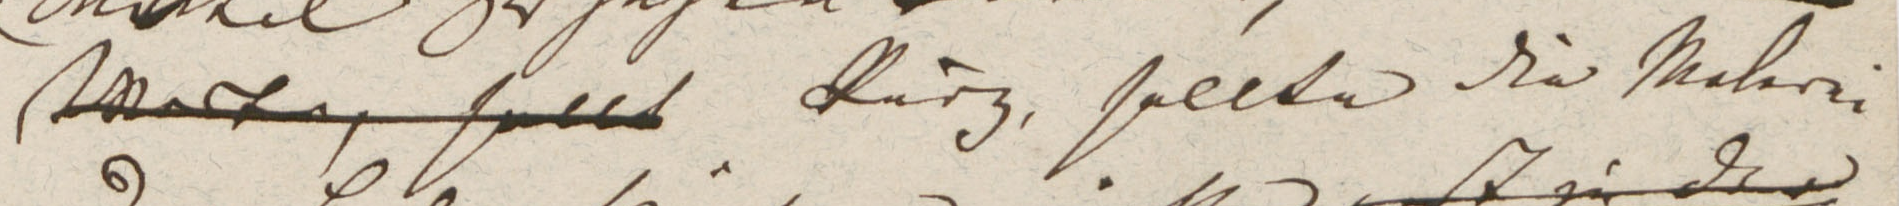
Werke, sollt kurz, sollte die Malerei
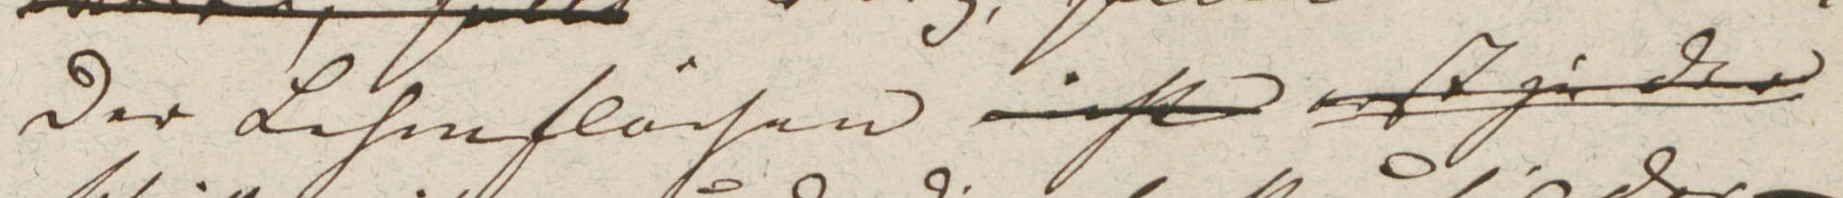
der Lehmflächen nicht erst zu der
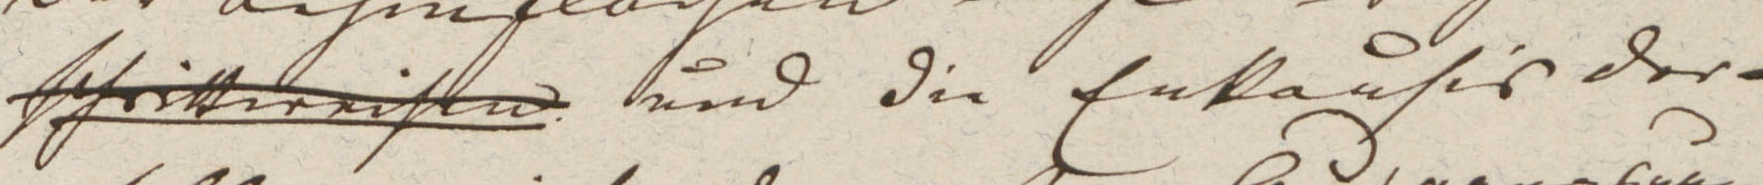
schrittweisen und die Enkausis der-
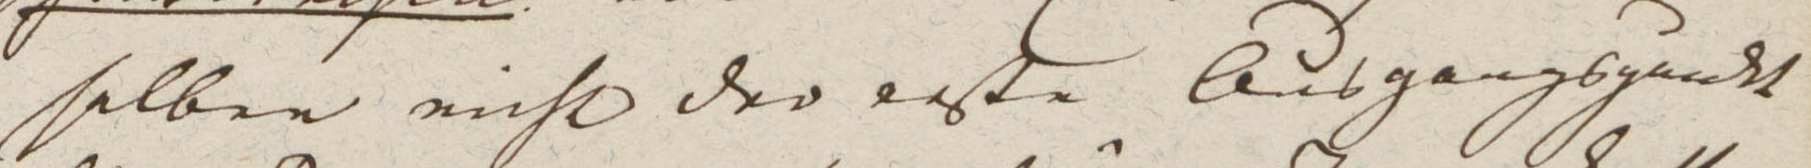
selben nicht der erste Ausgangspunkt
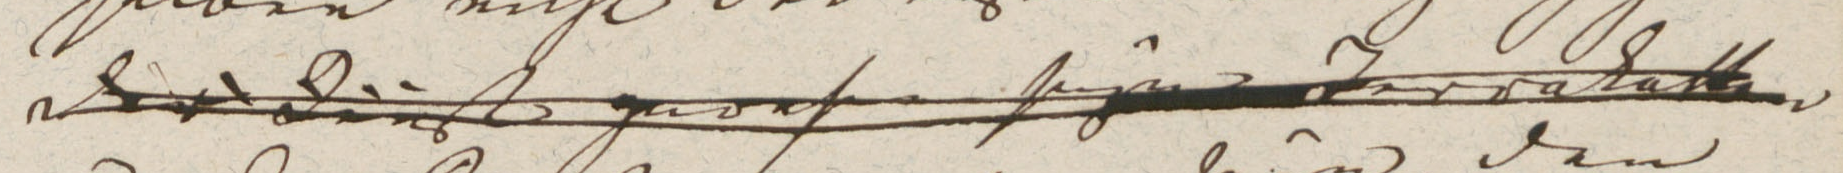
der Kunst gewesen seyn Terrakotten
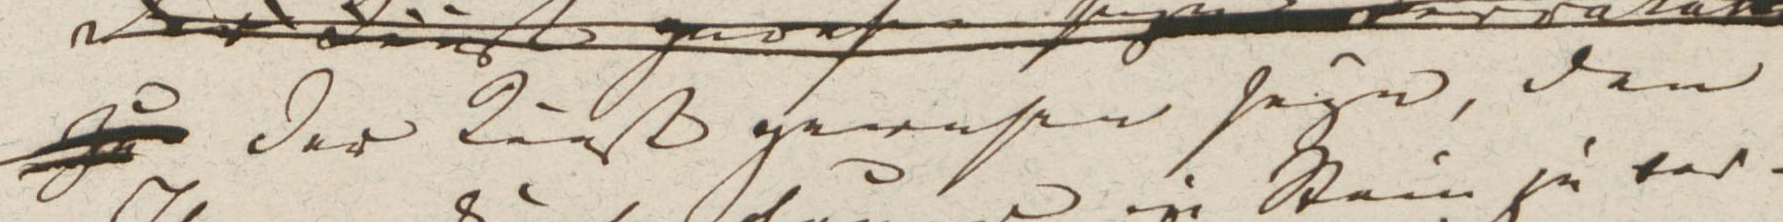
zu der Kunst gewesen seyn, den
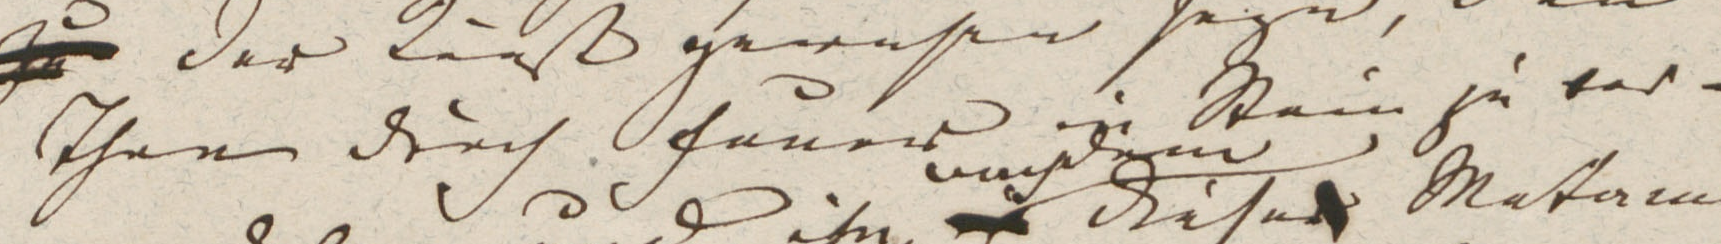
Thon durch Feuer in Stein zu ver-
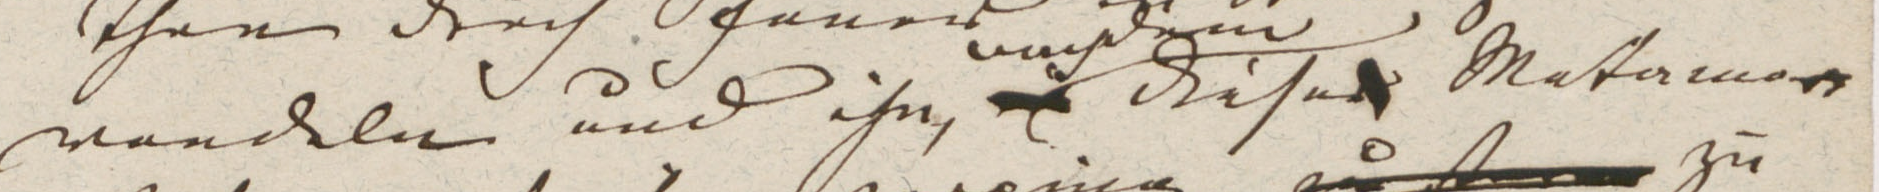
wandeln und ihn, nachdem dieses Metamo
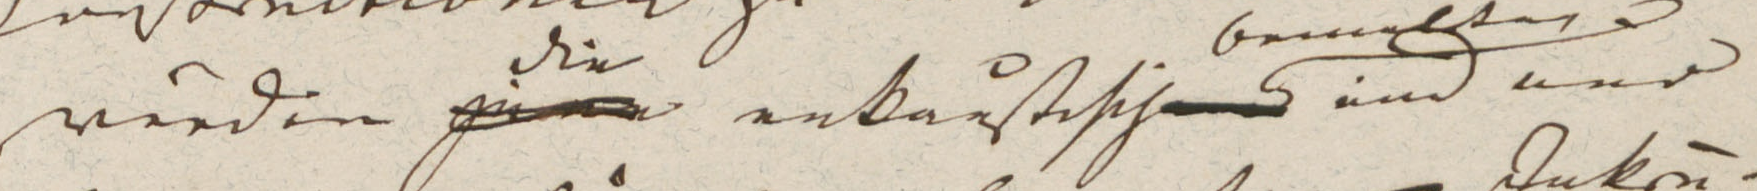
würden jene die enkaustischen bemalten und nur
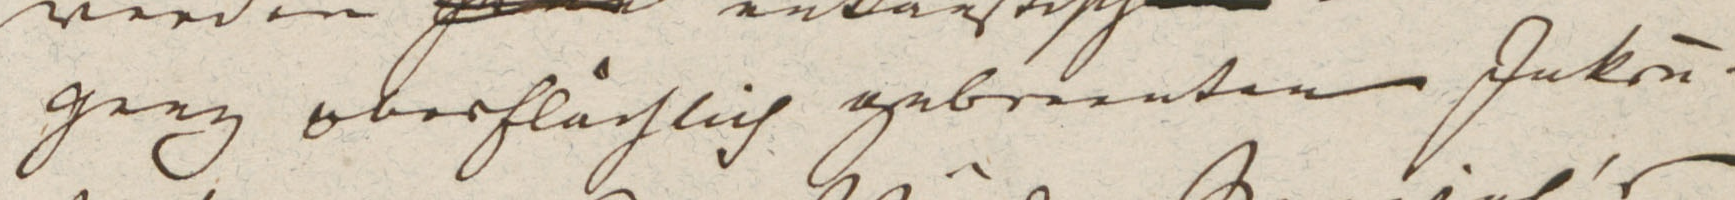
ganz oberflächlich gebrannten Inkru-
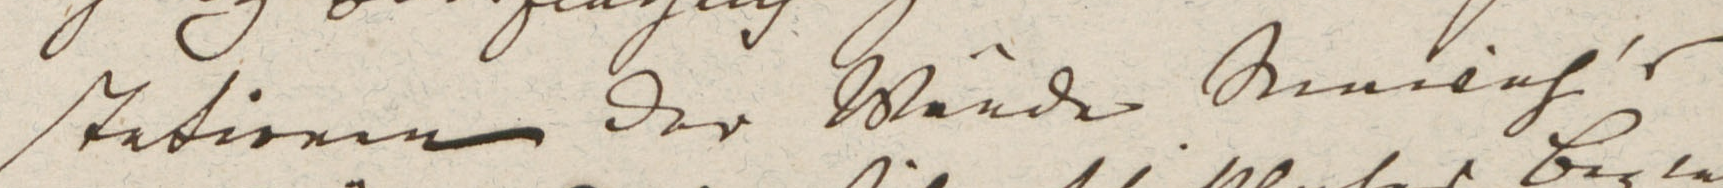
stationen der Wände Niniveh's
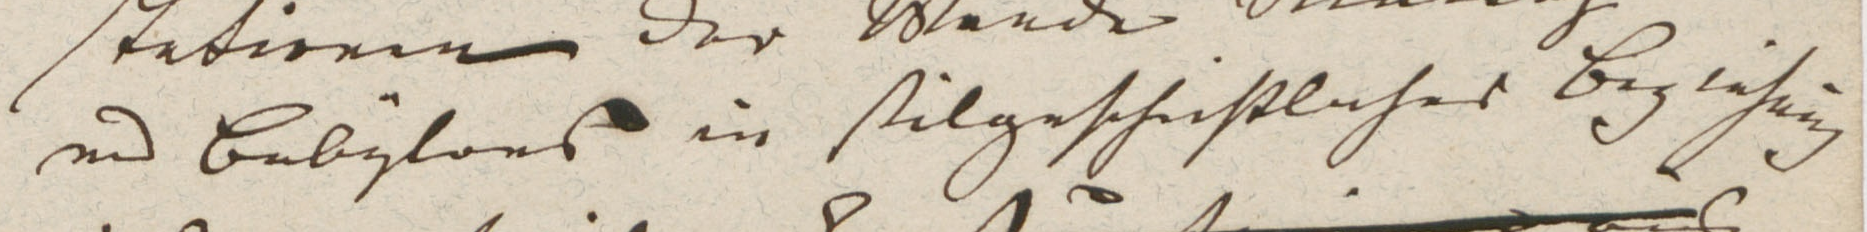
und Babylons in stilgeschichtlicher Beziehung
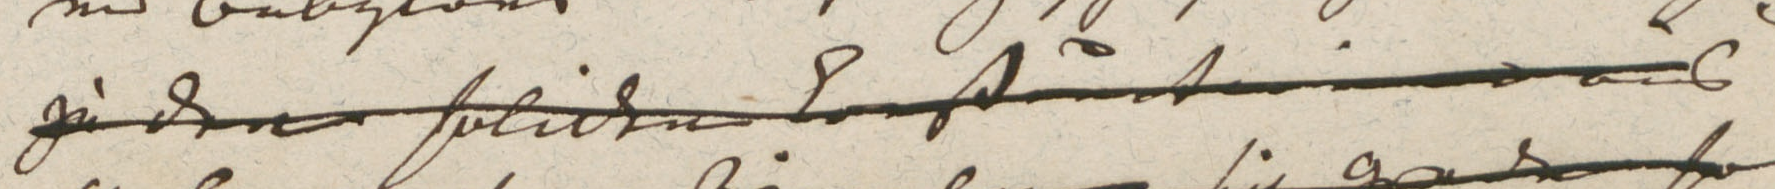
zu den soliden Constructionen aus
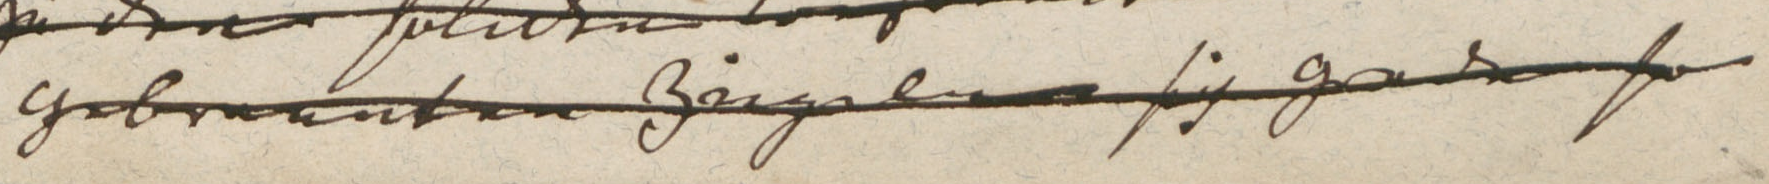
gebrannten Ziegeln sich gerade so
